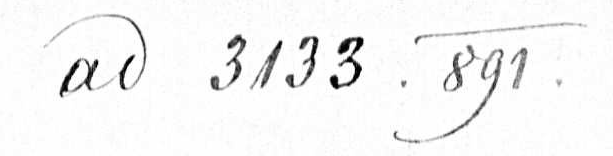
ad 3133 1891
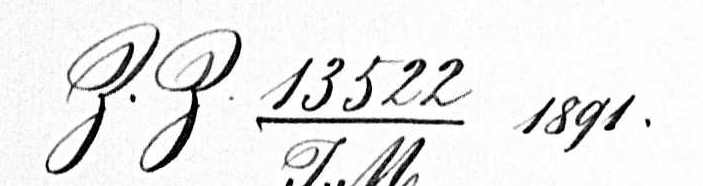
ZZ 13522/ 1891
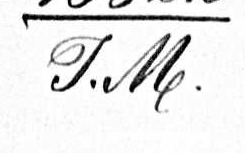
JM
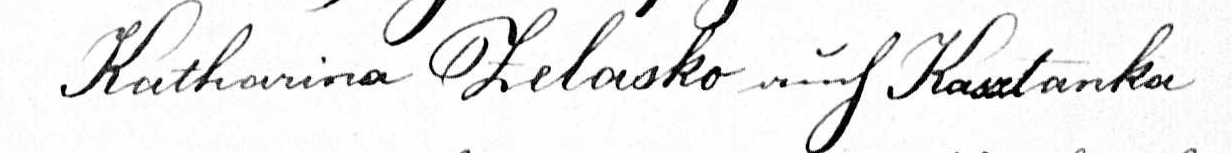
Katharina Želasko, auch Kasztanka
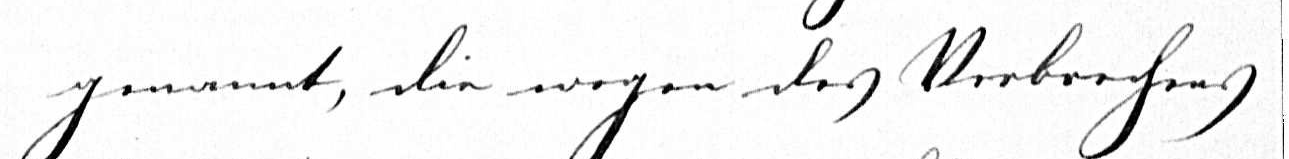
genannt, die wegen des Verbrechens
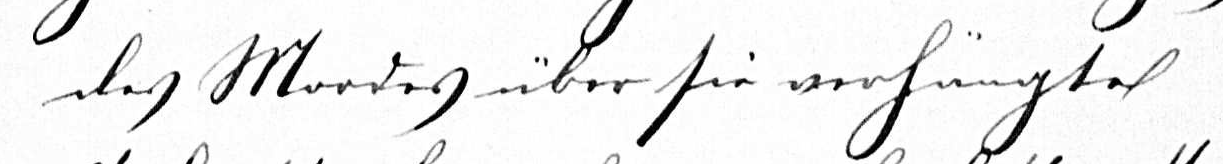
des Mordes über sie verhängte
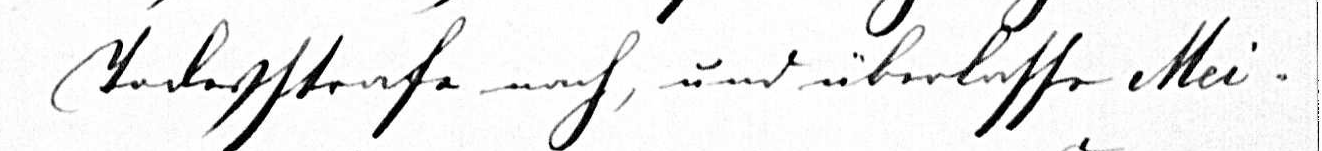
Todesstrafe nach und überlasse Mei¬
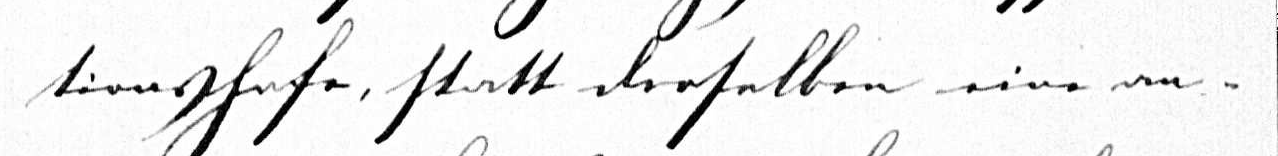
tionshofe, statt derselben eine an¬
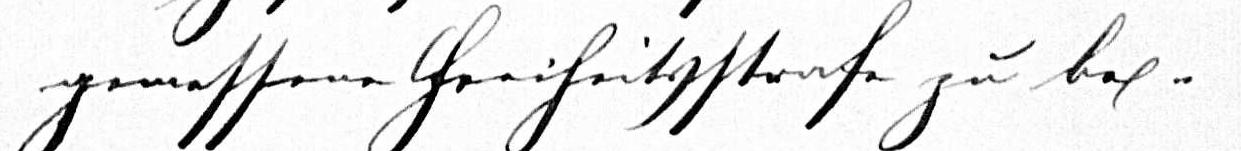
gemessene Freiheitsstrafe zu be¬
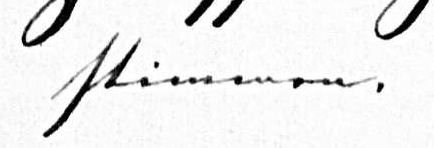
stimmen.
